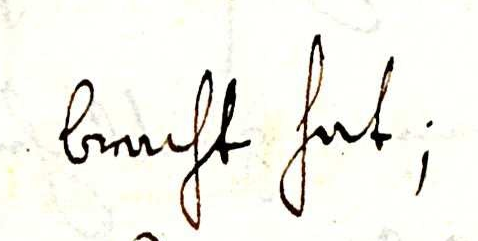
bracht hat;
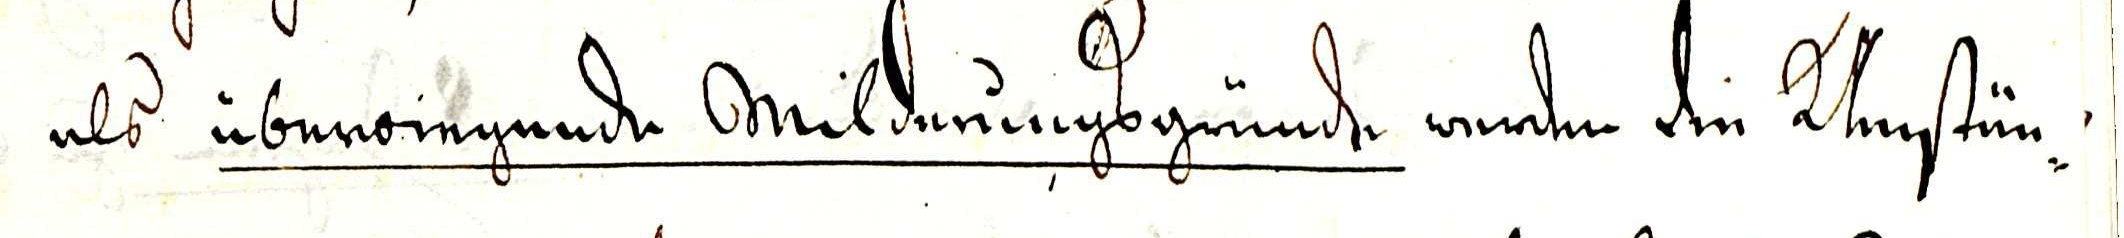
Als überwiegende Milderungsgründe werden die Umstän¬
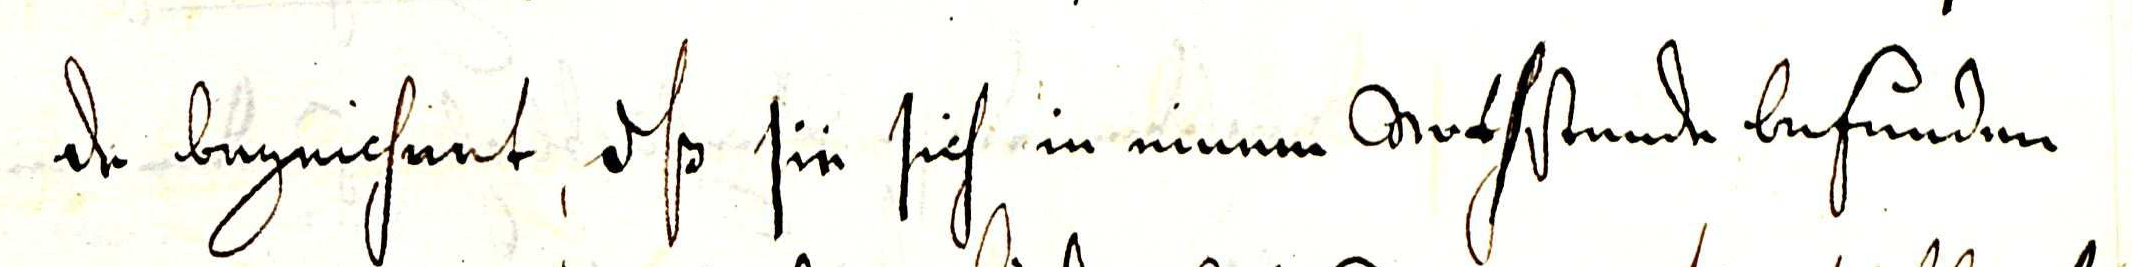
de bezeichnet, daß sie sich in einem Notstande befunden
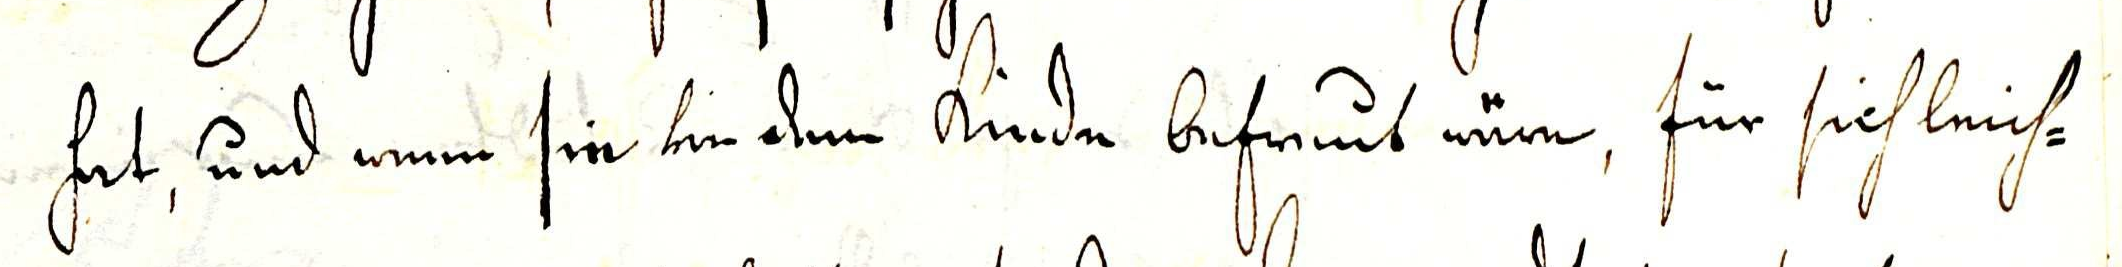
hat, und wenn sie von dem Kinde befreit wäre, für sich leich¬
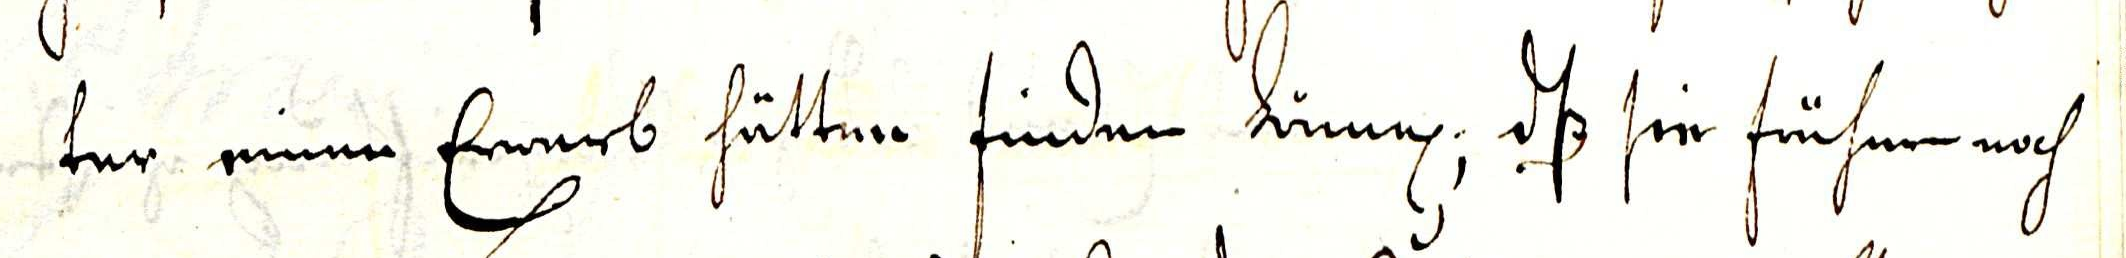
ter einen Erwerb hätten finden können; daß sie früher noch
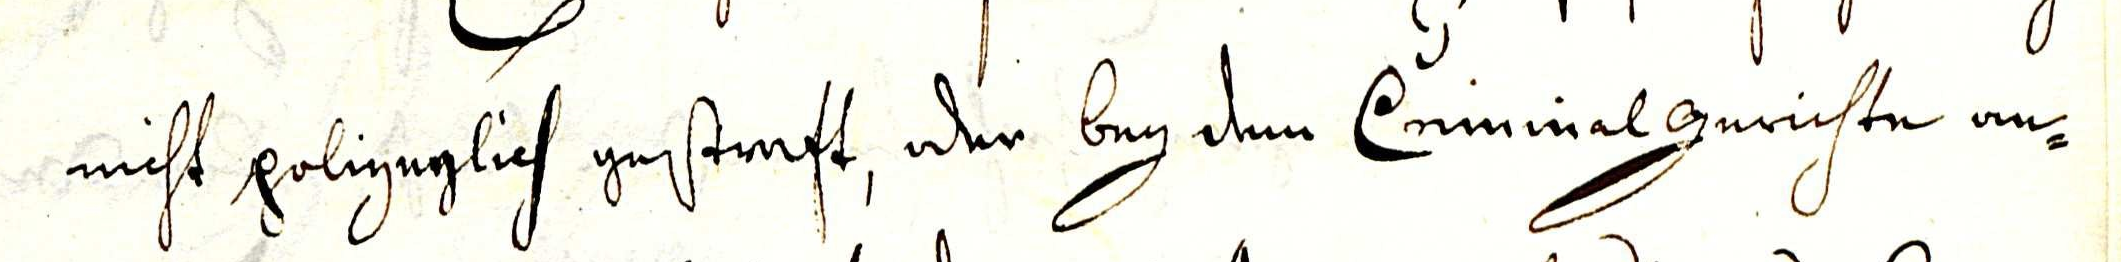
nicht polizeylich gestraft, oder bey dem Criminalgerichte an¬
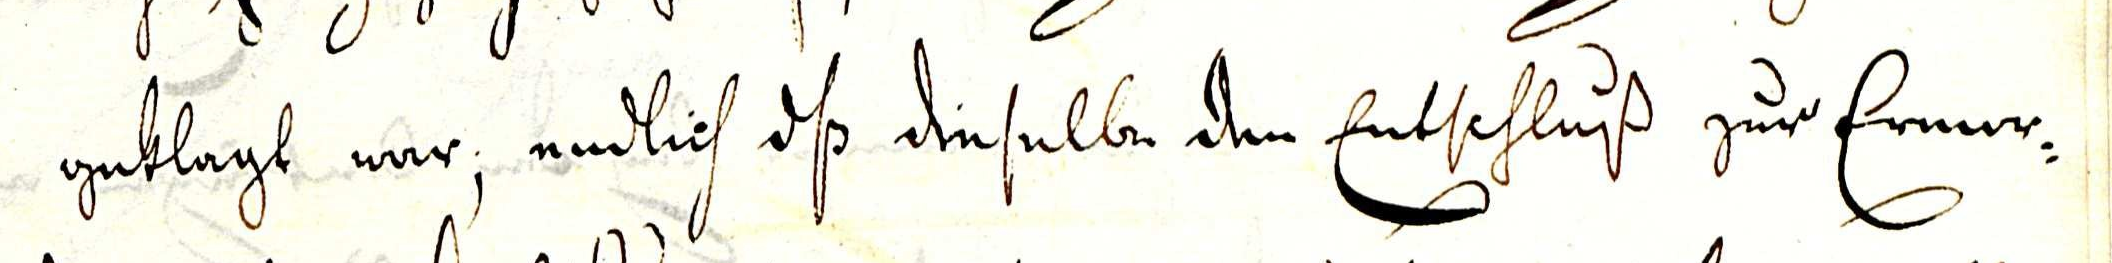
geklagt war, endlich daß dieselbe den Entschluß zur Ermor¬
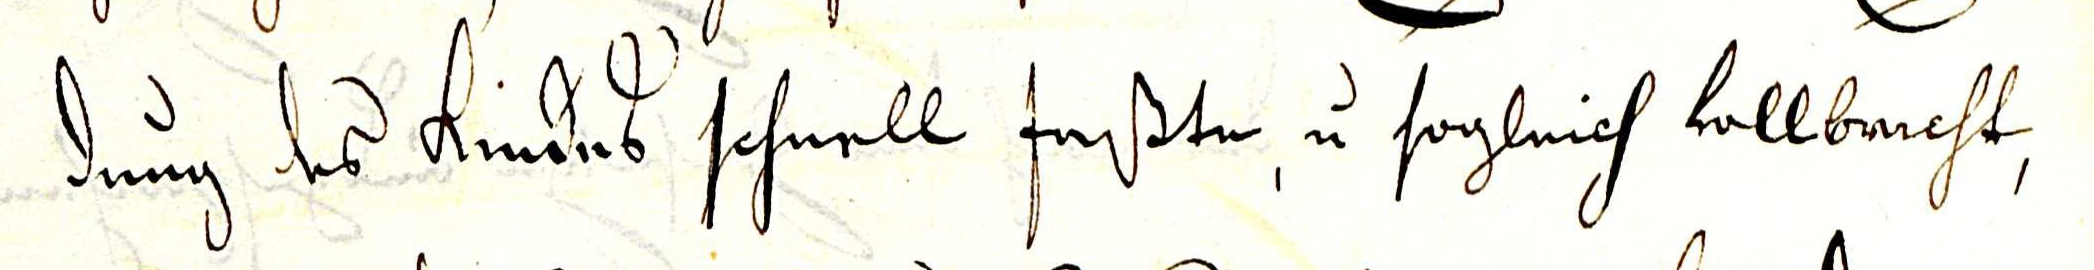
dung des Kindes schnell faßte, u sogleich vollbracht,
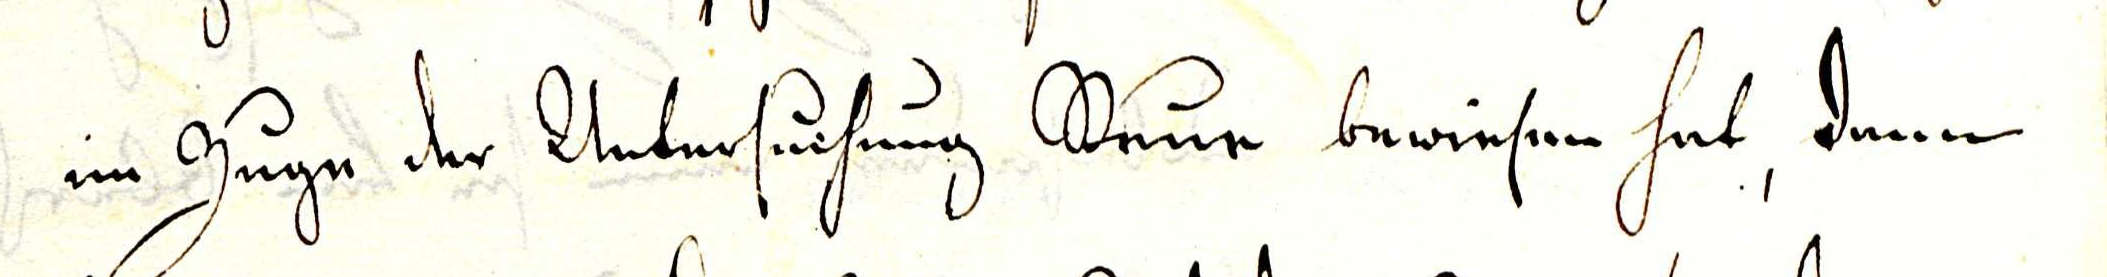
im Zuge der Untersuchung Reue bewiesen hat, denn
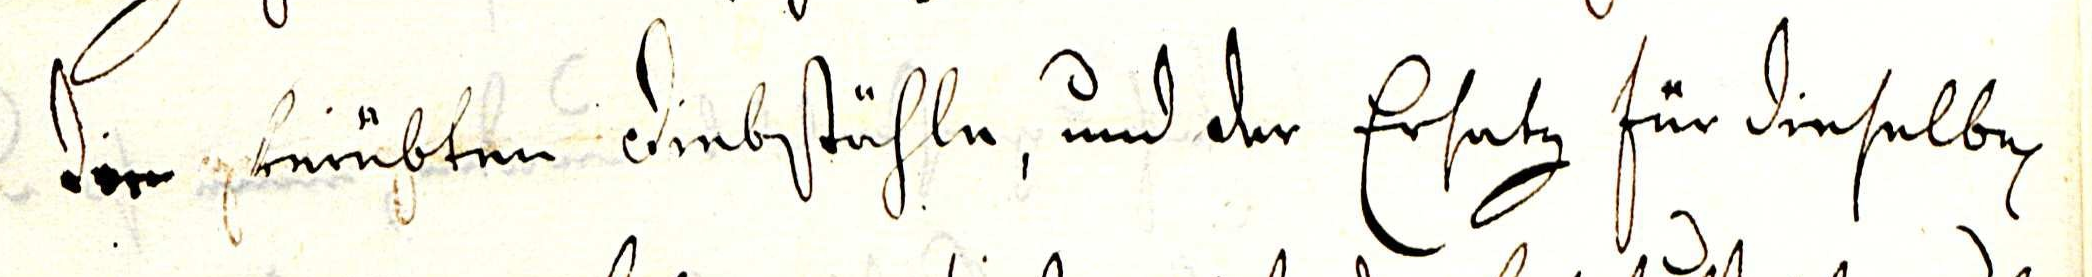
der verübten Diebstähle, und der Ersatz für dieselbe
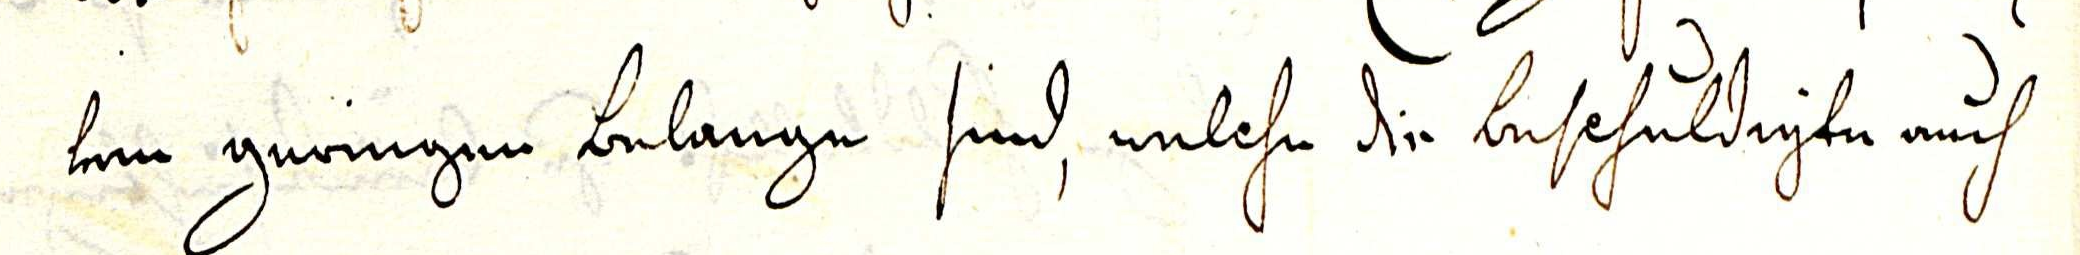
vom geringen Belange sind, welche die beschuldigte auch
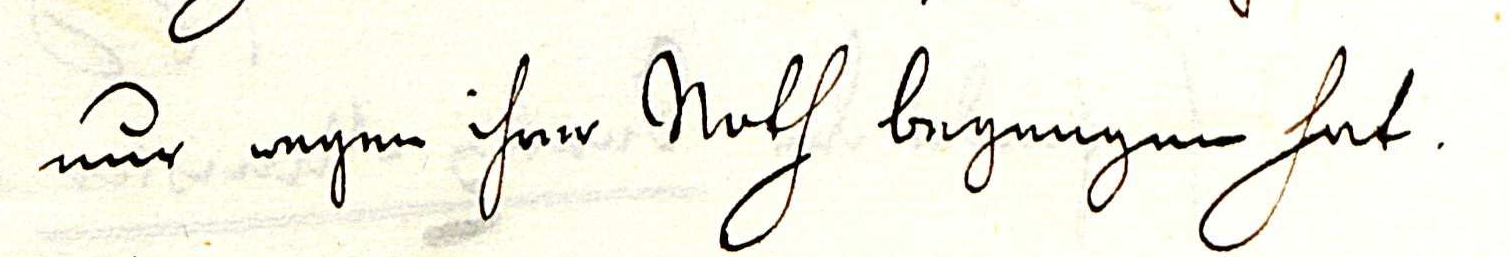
nur wegen ihrer Noth begangen hat.
